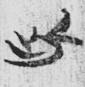此
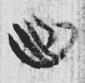出
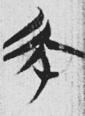帀（師）
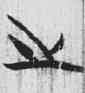之
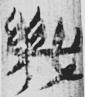幾（忌）
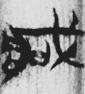○（莊）
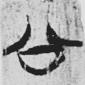公
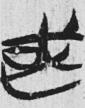或（又）
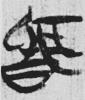䎽（問）
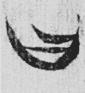曰
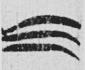三
